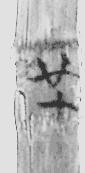{廿七}
